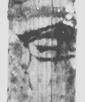隹
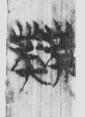{丵人丵人}
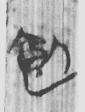飤
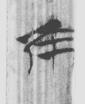隹
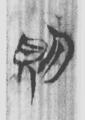{見勿}
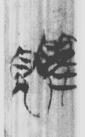觀
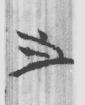之
